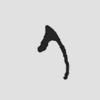人
